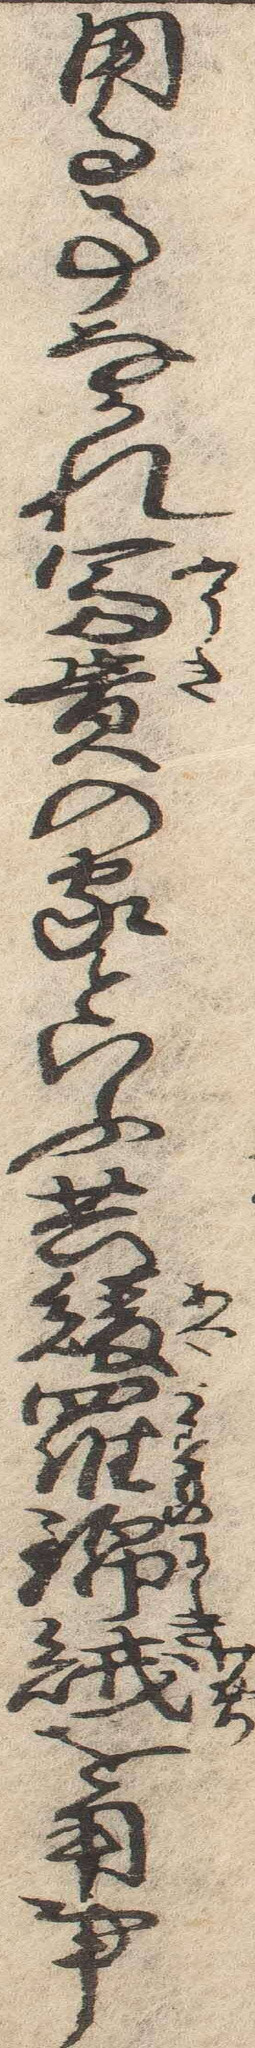用る事なかれ富貴の家といふ共綾羅錦絨を用事
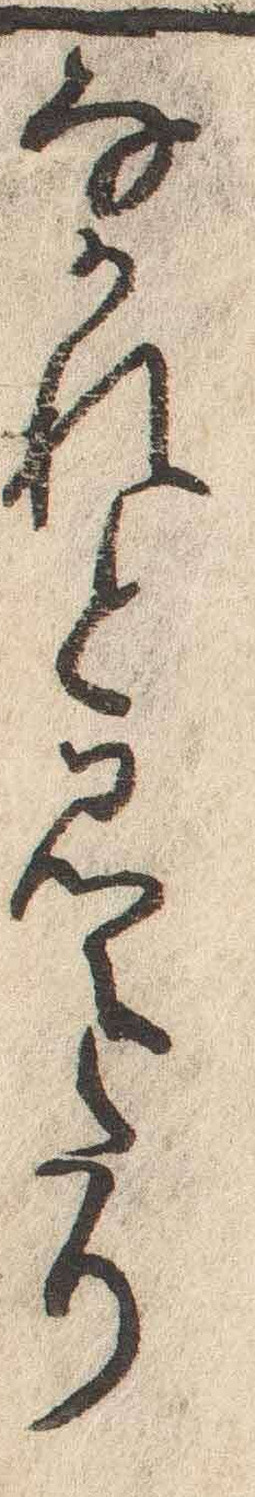なかれと見えたり
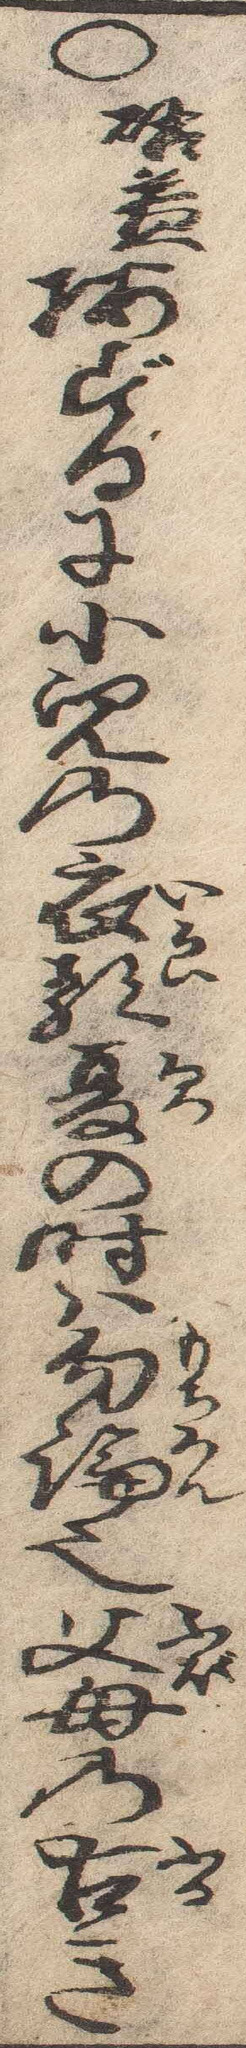◯啓益按ずるに小児の衣類夏の時は勿論也父母の古き

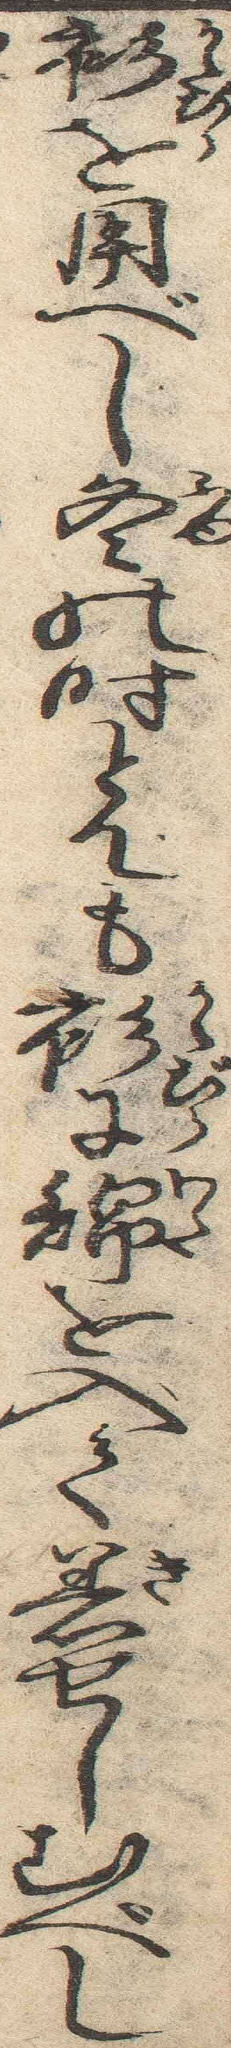衫を用べし冬の時とても衫に綿を入て着せしむべし
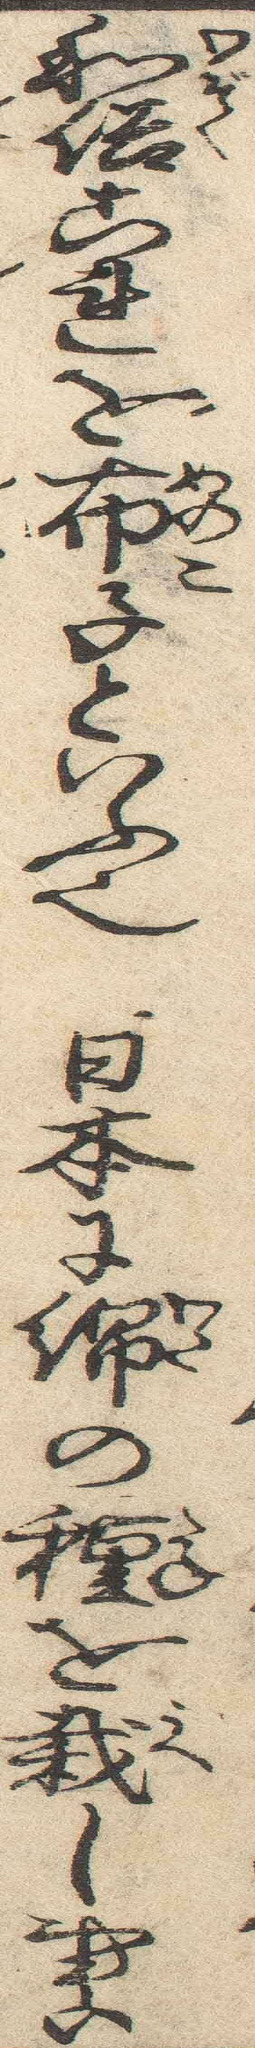和俗これを布子といふ也日本に綿の種を栽し事は
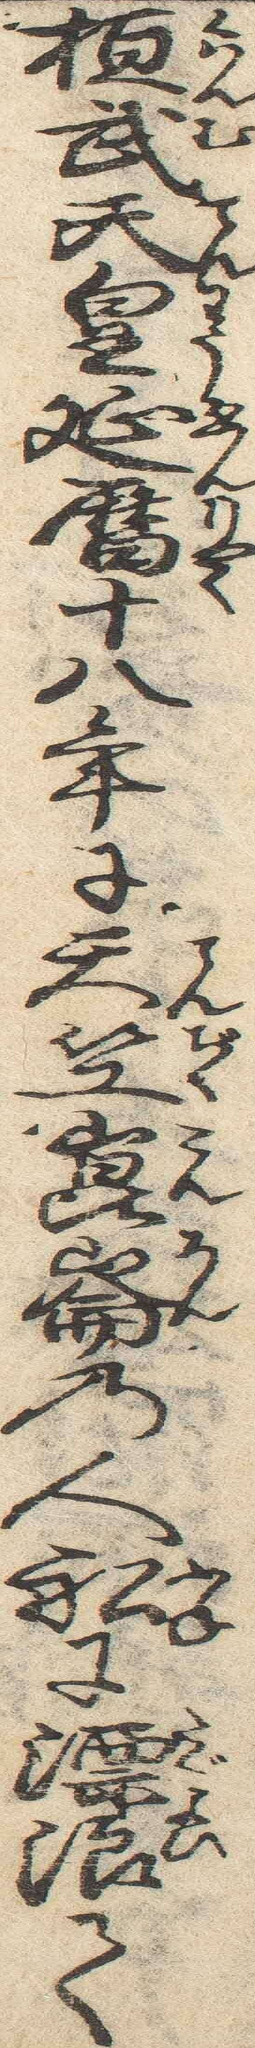桓武天皇延暦十八年に天竺崑崙の人舩に漂浪て
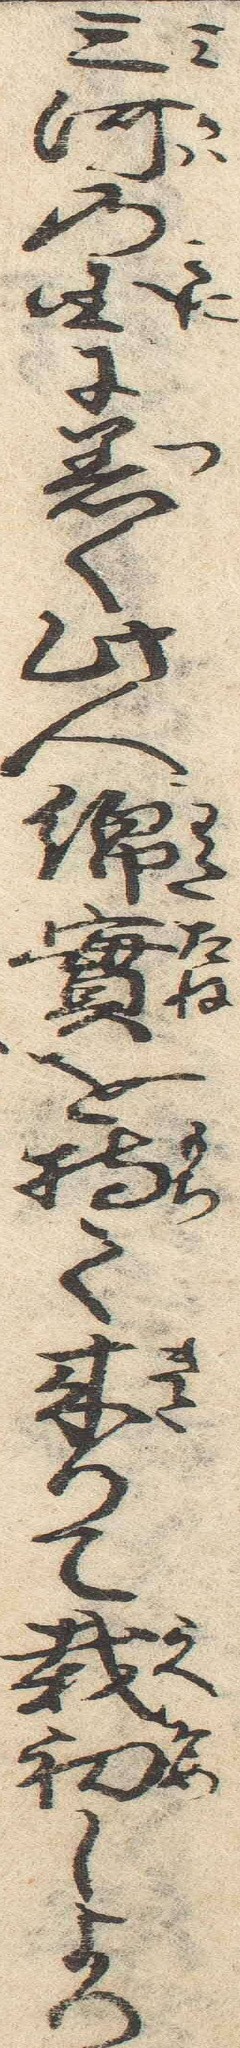三河の国に着く此人綿實を持て來りて栽初しより
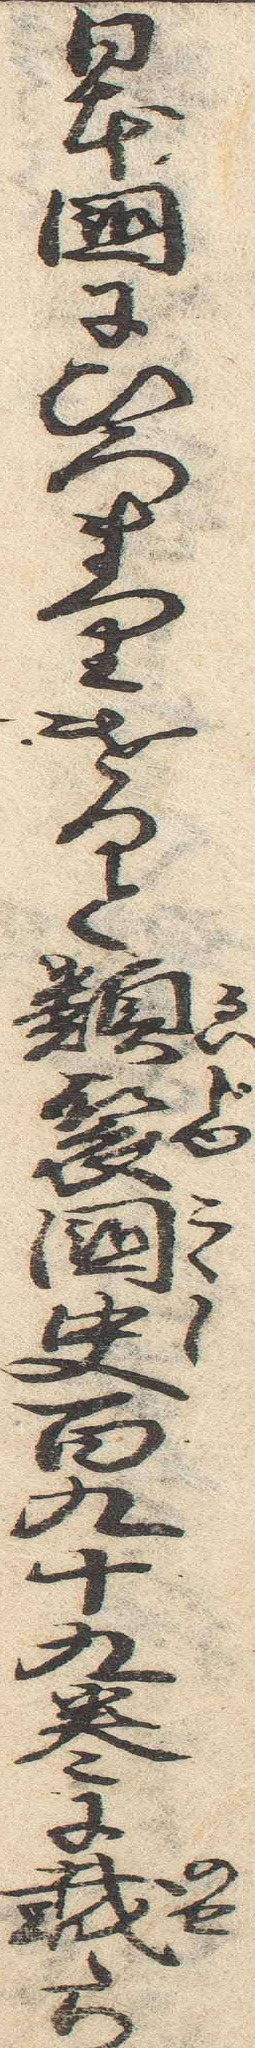日本國にひろまりけると類聚國史百九十九巻に載たり
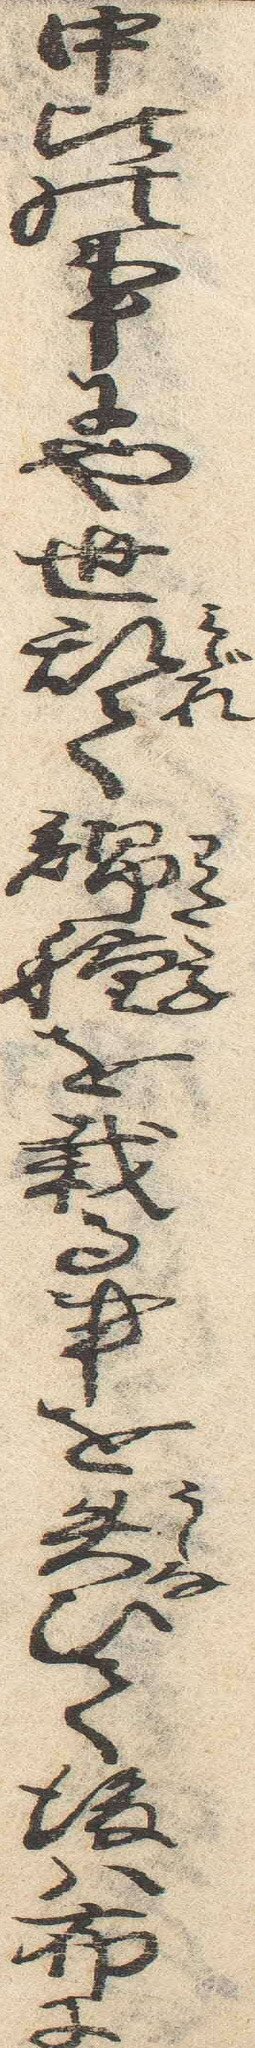中頃の事にや世乱て綿種を栽る事を失ひて後は布に
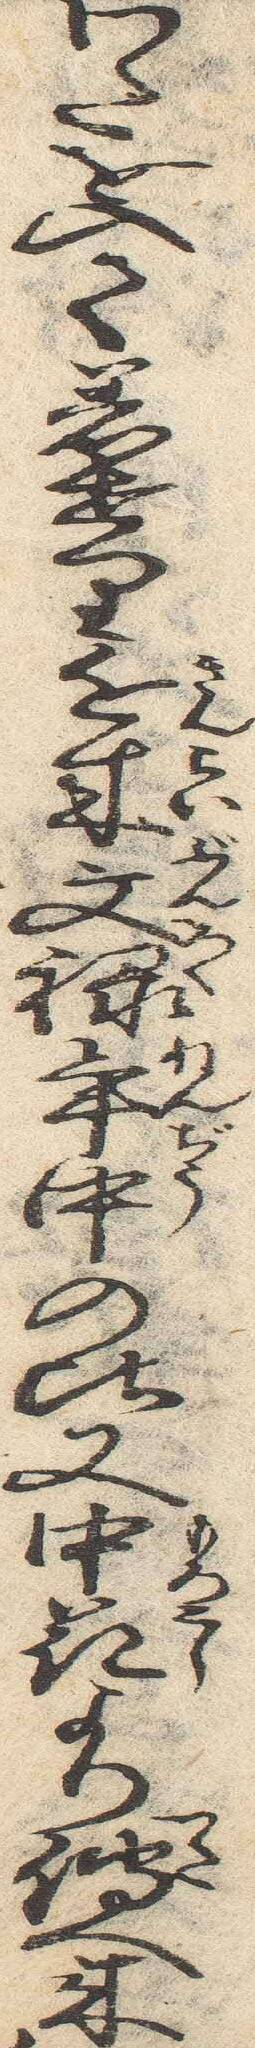わたを入て着けり近來文禄年中の頃又中花より伝へ來
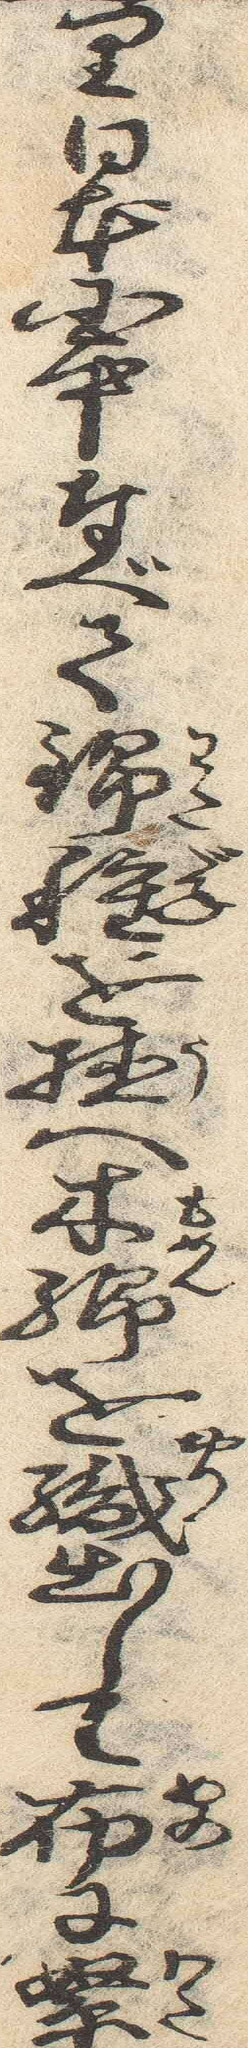り日本國中なべて綿種を植へ木綿を織出して布に絮
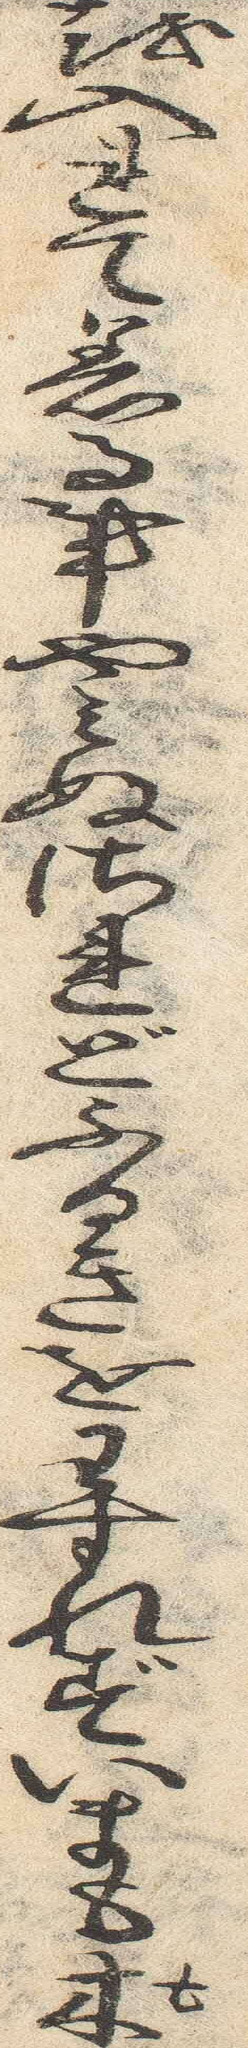を入れて着る事やみぬされどふるきをわすれずいまも木
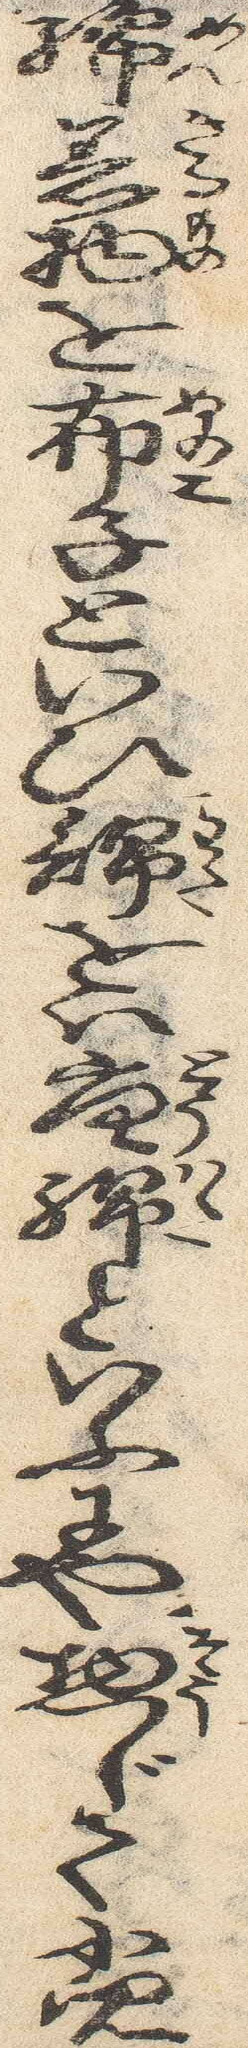綿着物を布子といひ綿をは唐綿といふにや惣じて小児
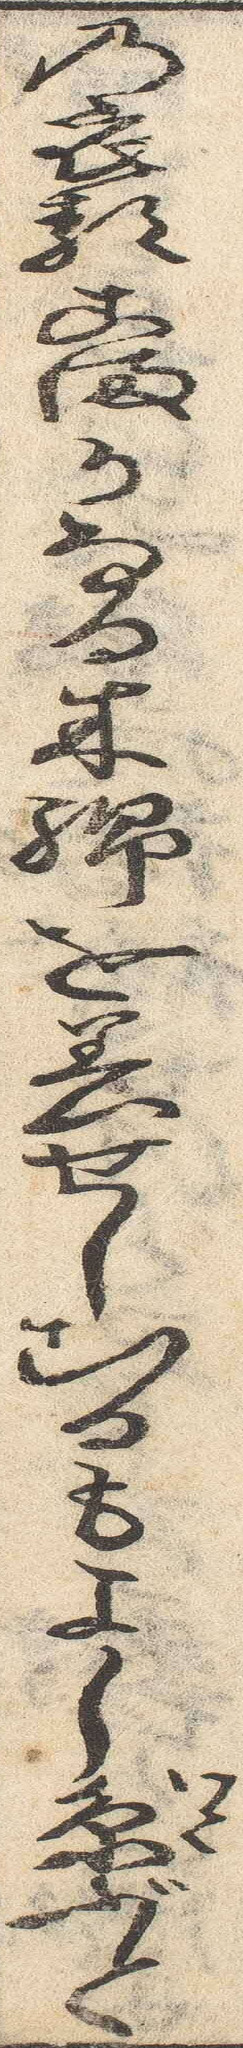の衣類こまかなる木綿を着せしむるもよし糸ぶと
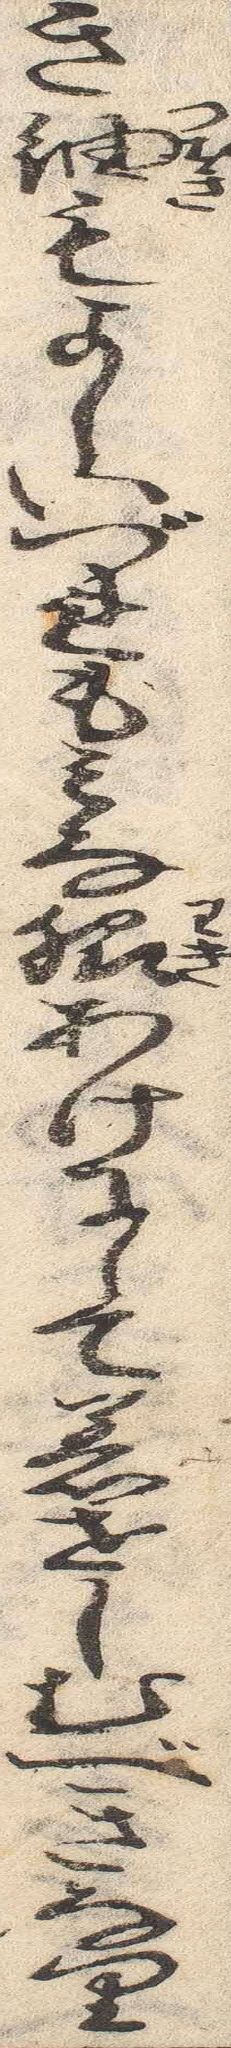き紬もよしいづれもみな脇あけにして着せしむべきなり
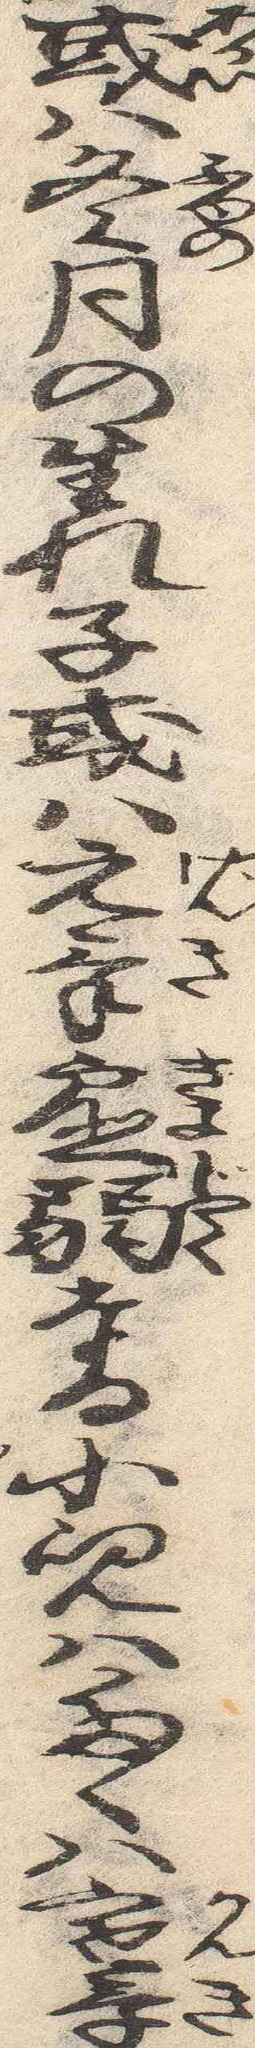或は冬月の生れ子或は元氣虚弱なる小児は多くは寒氣
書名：小児必用養育草
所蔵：東京学芸大学附属図書館 国文学研究資料館
